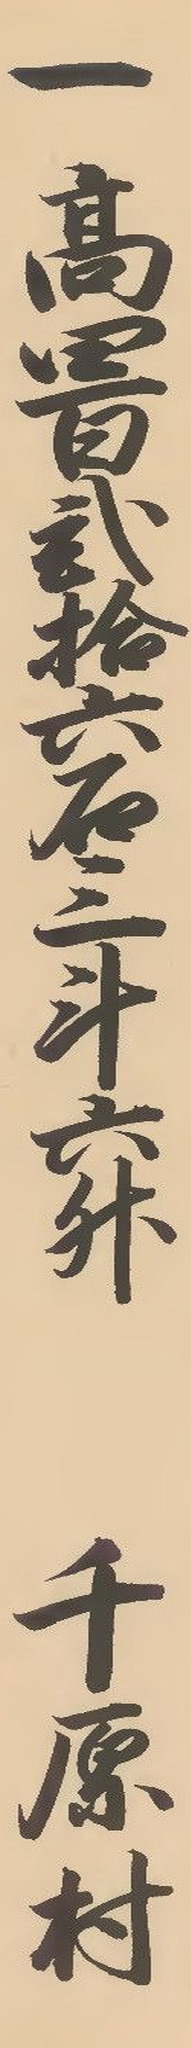一高四百弐拾六石三斗六升千原村
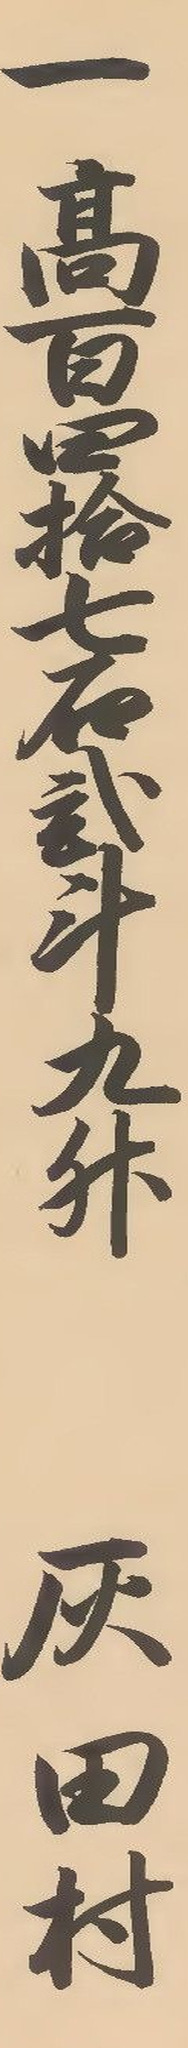一高百四拾七石弐斗九升灰田村

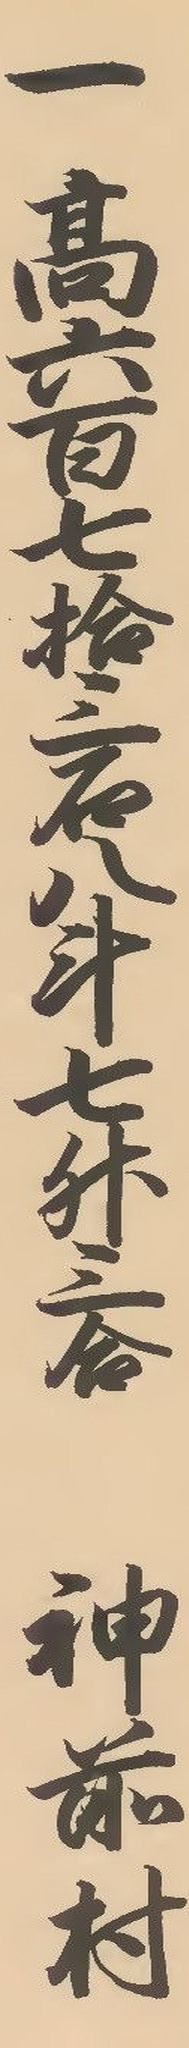一高六百七拾三石八斗七升三合神前村
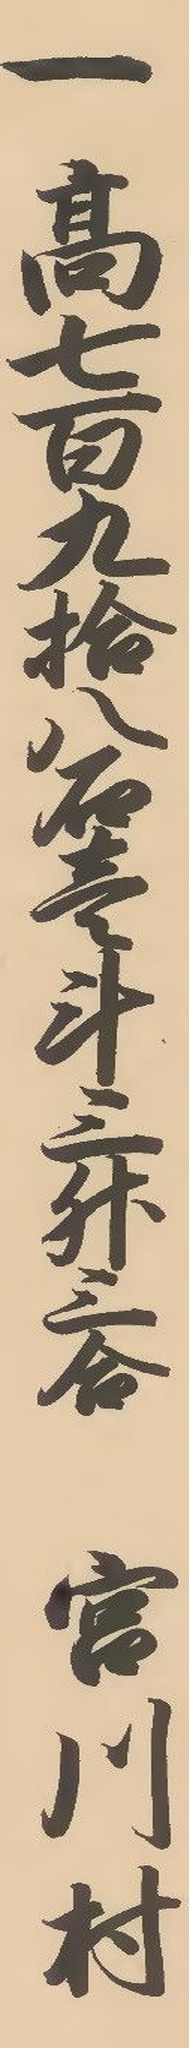一高七百九拾八石壱斗三升三合宮川村
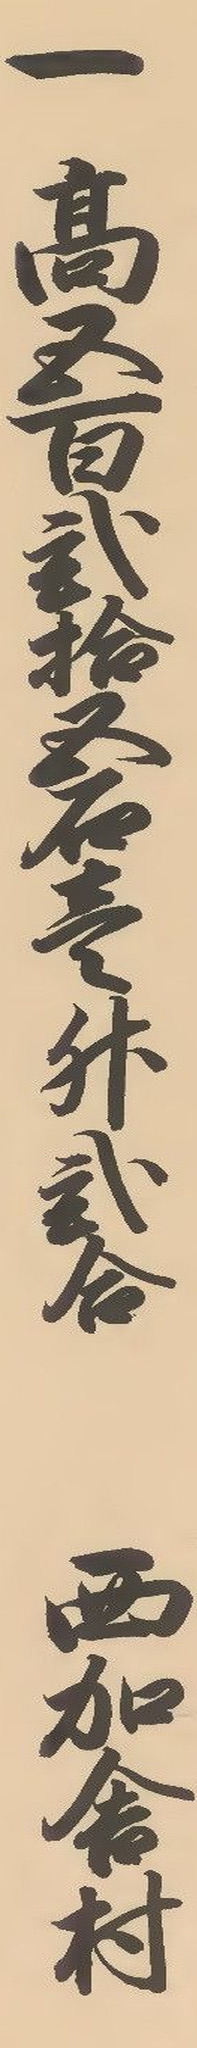一高五百弐拾五石壱升弐合西加舎村
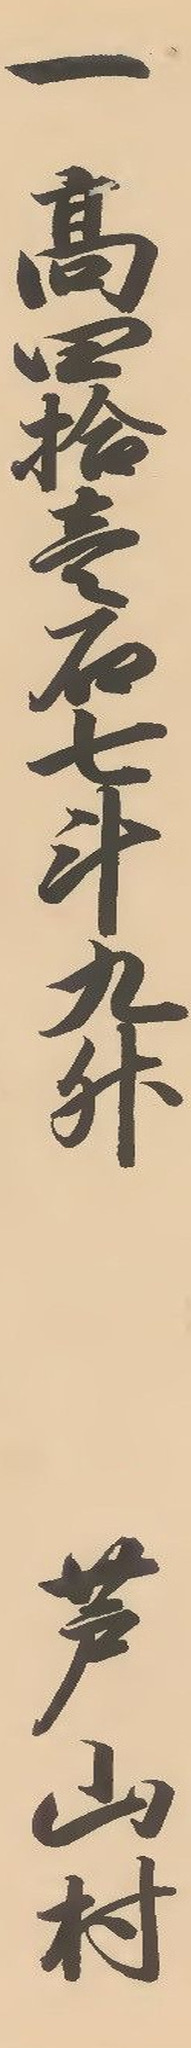一高四拾壱石七斗九升芦山村
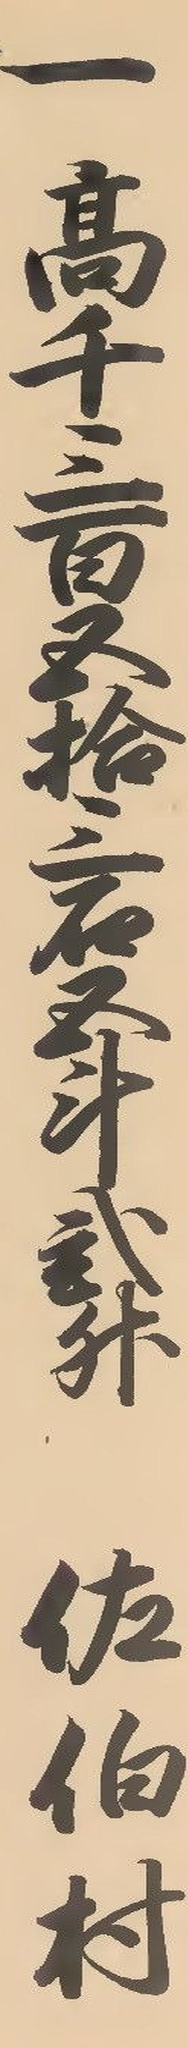一高千三百五拾三石五斗弐升佐伯村
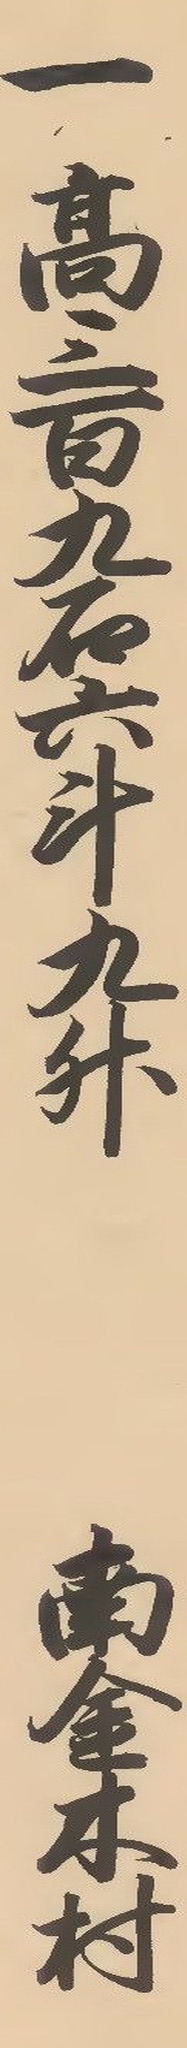一高三百九石六斗九升南金木村
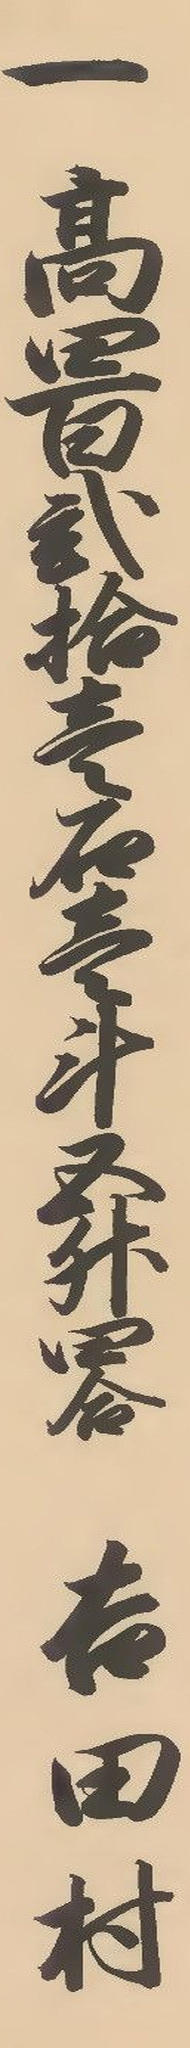一高四百弐拾壱石壱斗五升四合吉田村
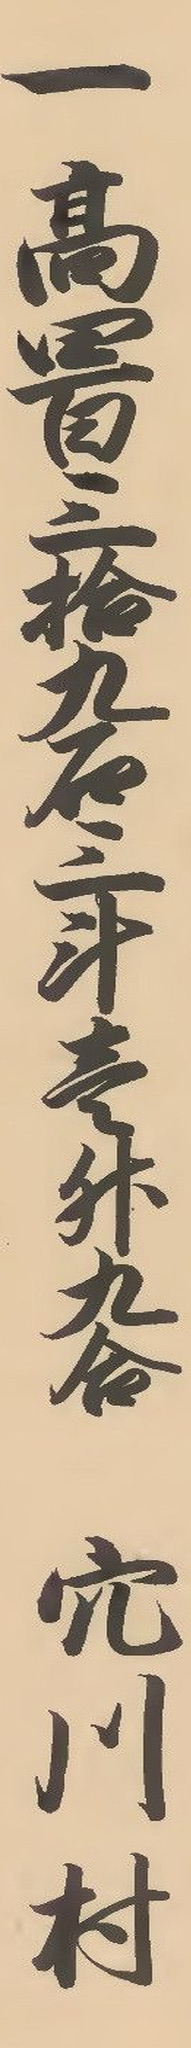一高四百三拾九石三斗壱升九合穴川村

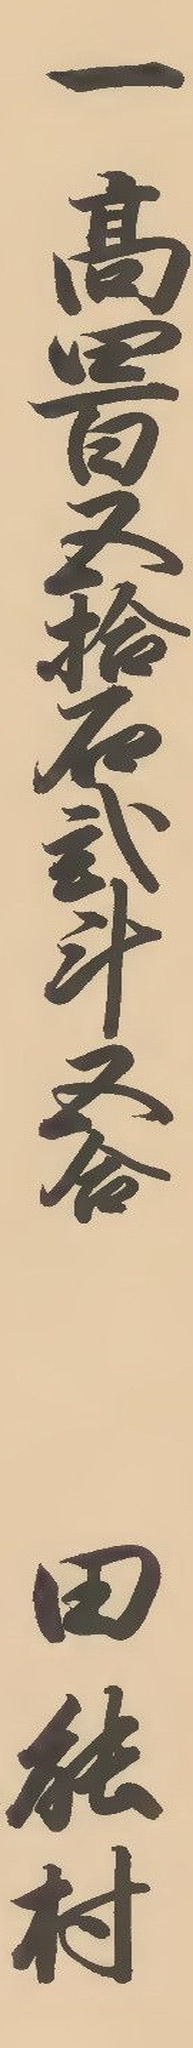一高四百五拾石弐斗五合田能村
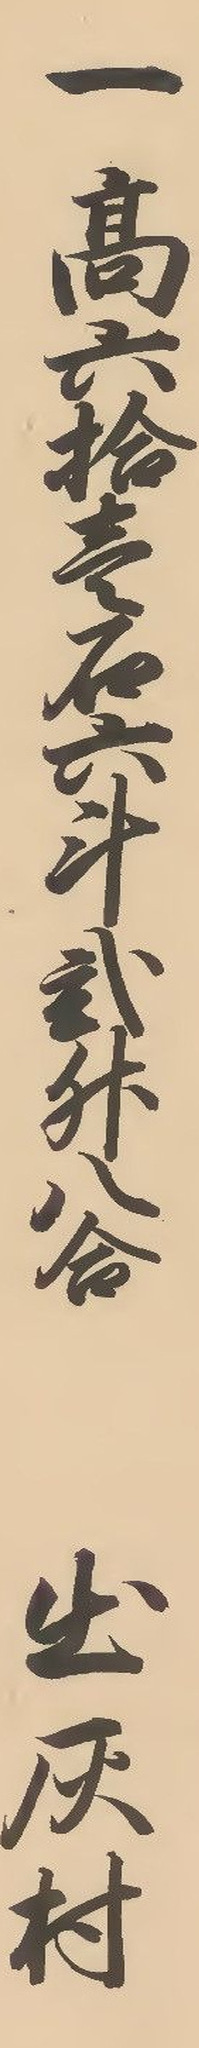一高六拾壱石六斗弐升八合出灰村
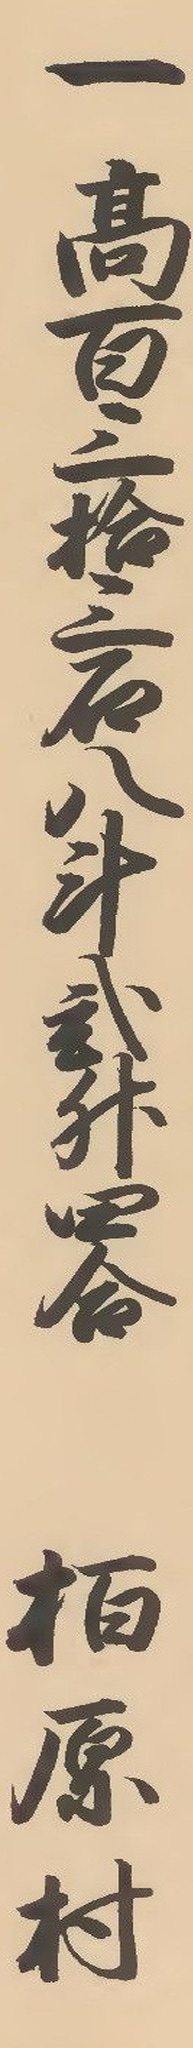一高百三拾三石八斗弐升四合栢原村
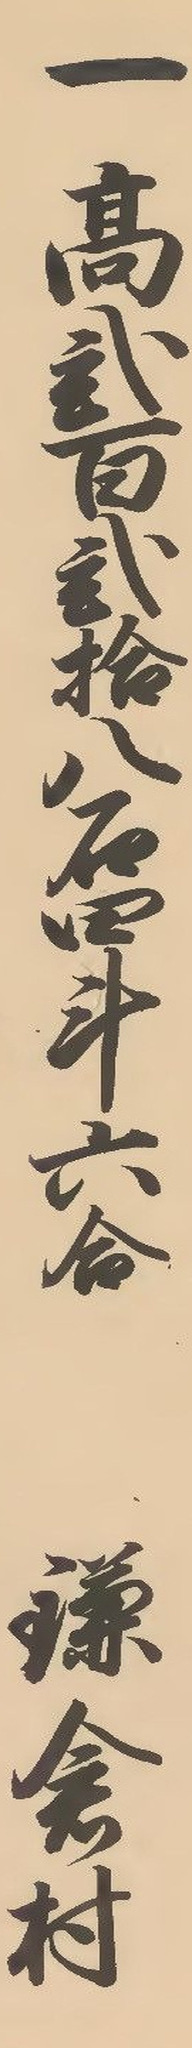一高弐百弐拾八石四斗六合鎌倉村
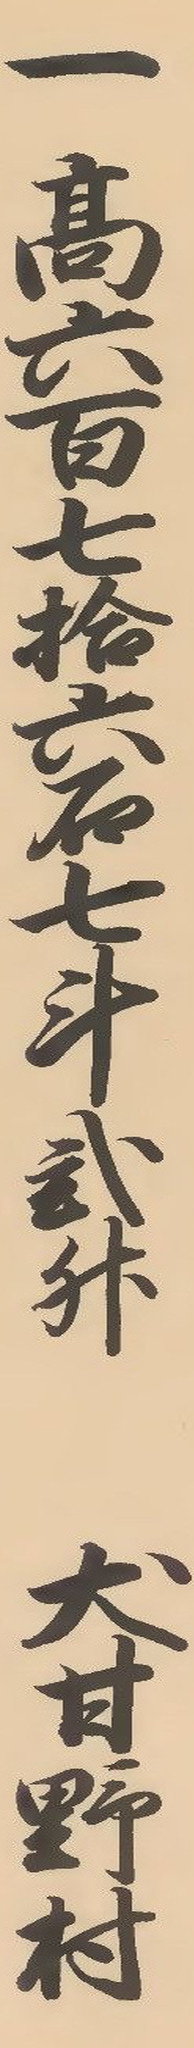一高六百七拾六石七斗弐升犬甘野村
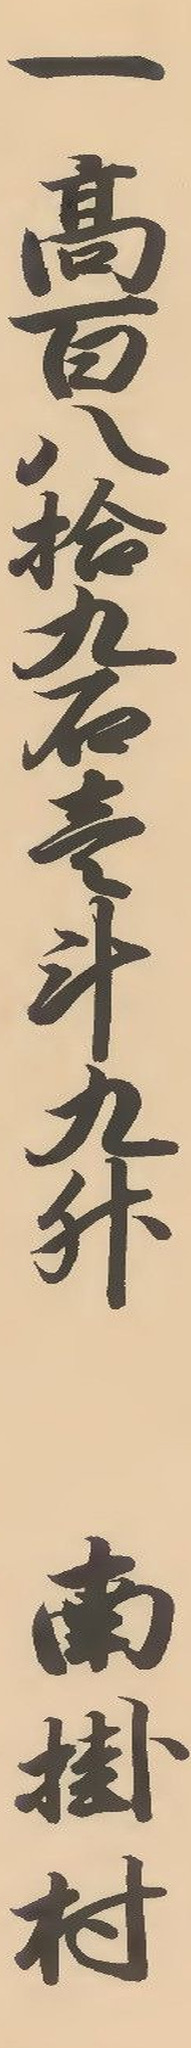一高百八拾九石壱斗九升南掛村
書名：丹波国郷帳
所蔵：国立公文書館 National Archives of Japan
